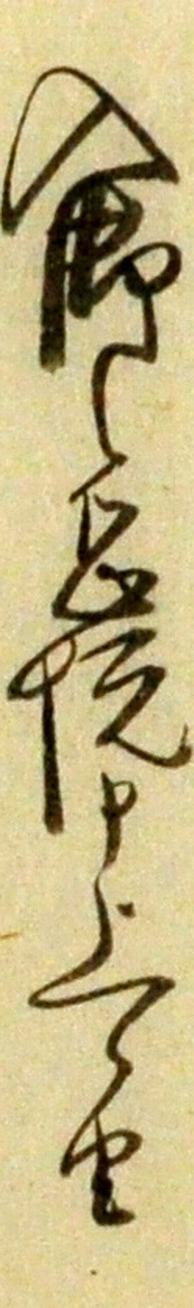入御之恐悦申上候由
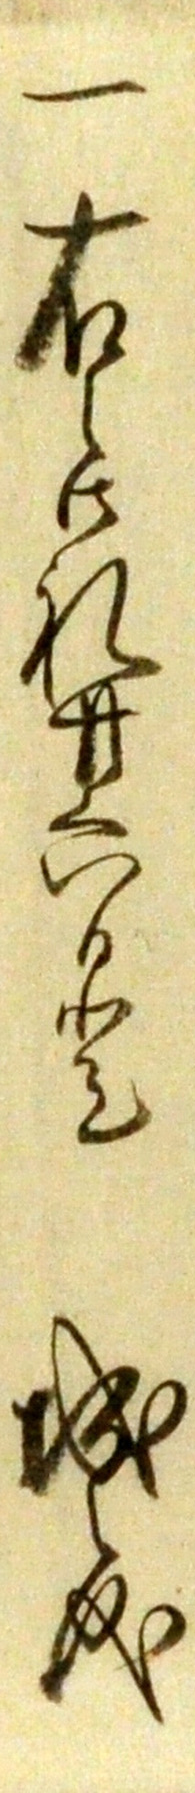一右之御礼廿六日登城之儀
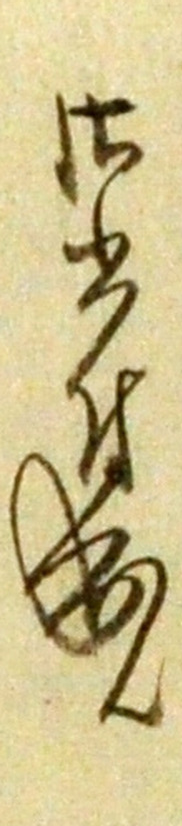御書付出ル
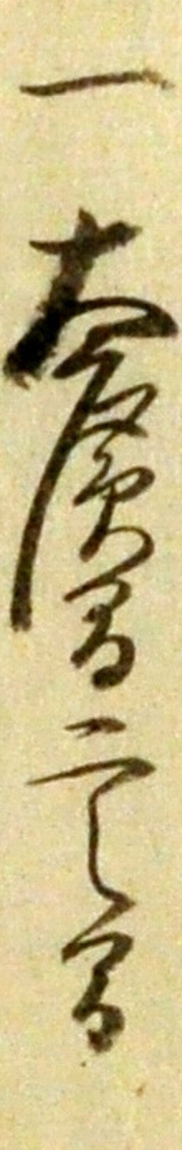一大広間二之間
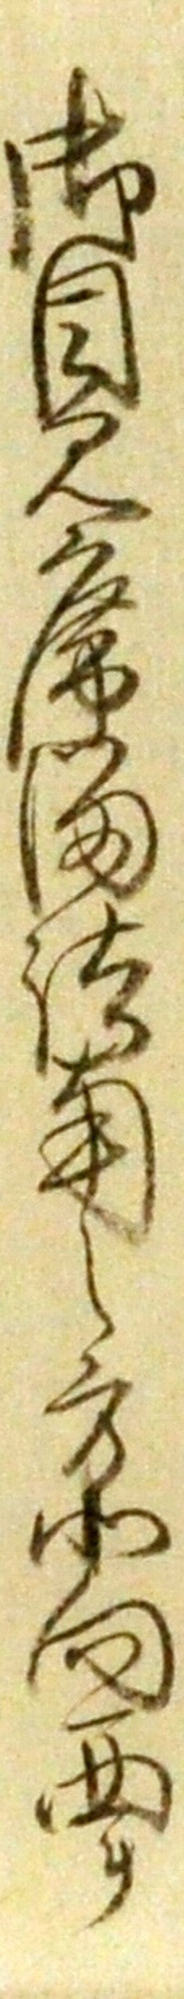御目見席溜詰南之方北向西に
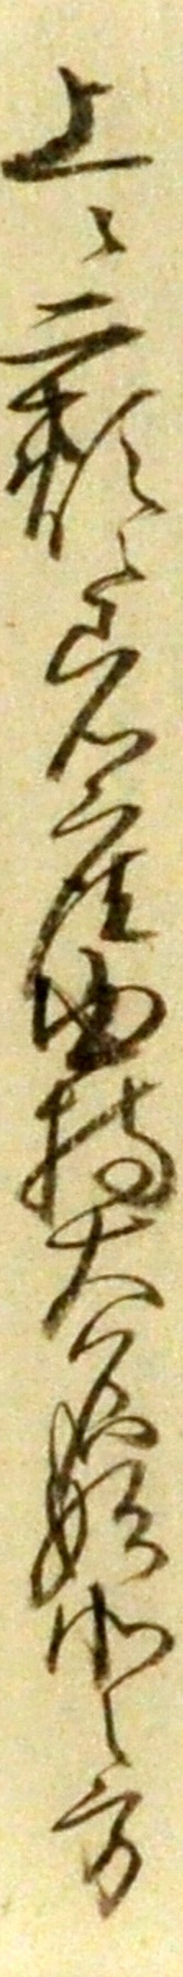上ニ二頬被着座国持大名始北之方
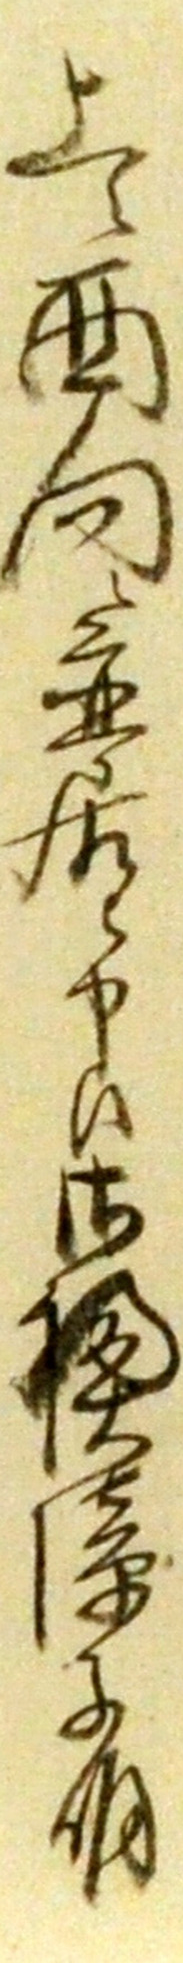上ニ西向ニ並居被申候御襖障子明

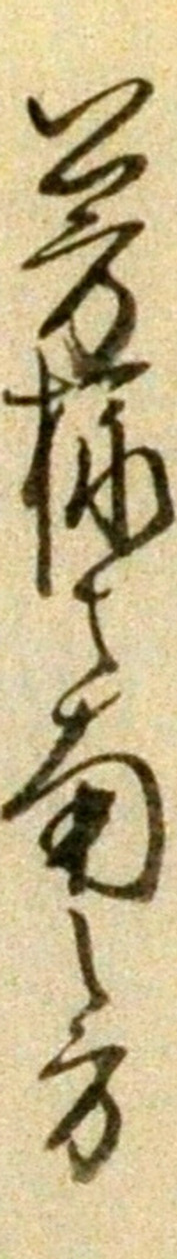公方様は南之方
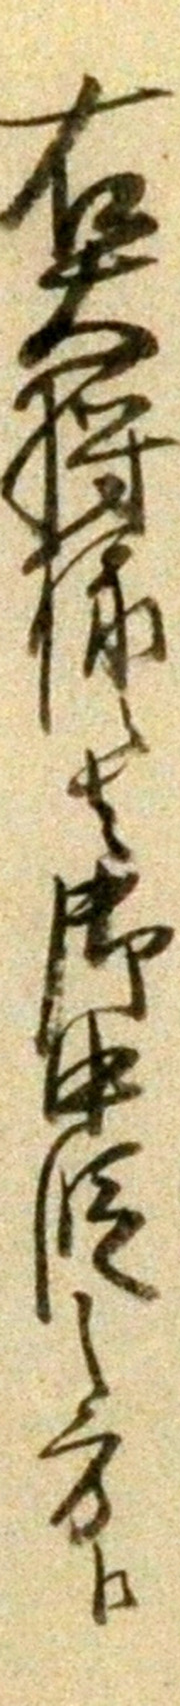右大将様ニは御中段之方え
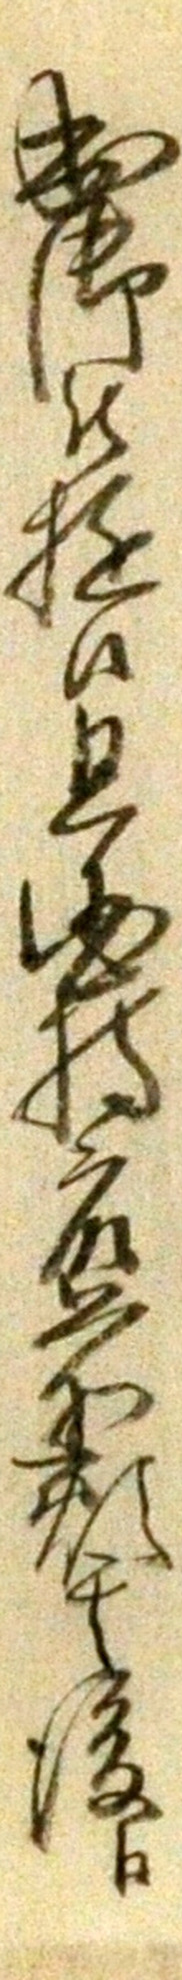出御被遊候且国持衆前頬其後え
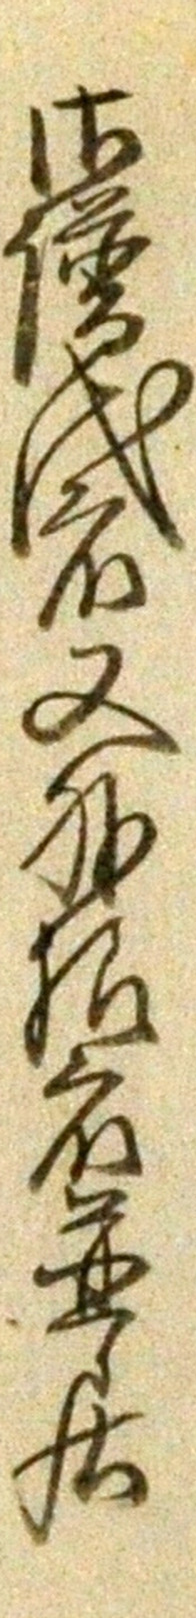御譜代衆又外様衆並居
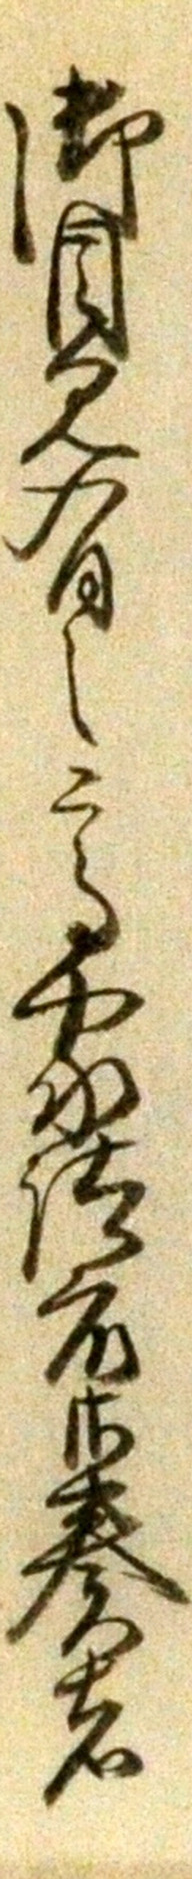御目見有之高家詰衆御奏者
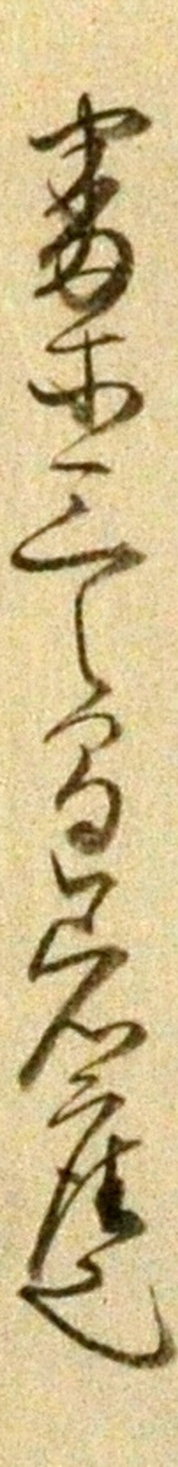番等三之間着座也
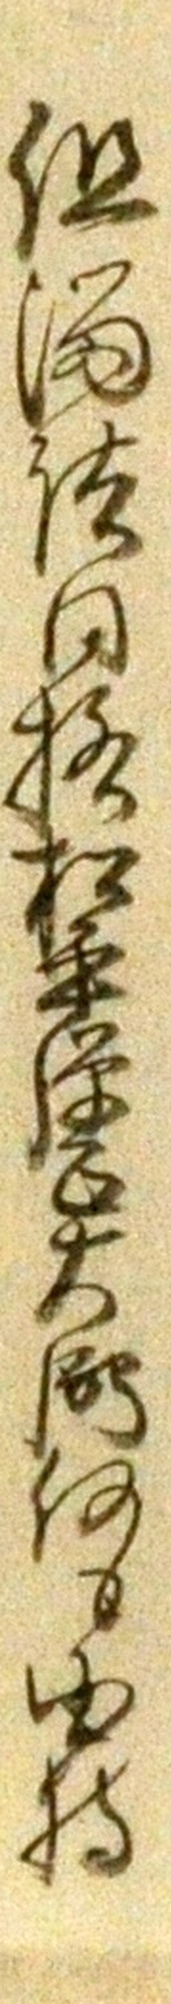但溜詰同格松平弾正大弼何も国持
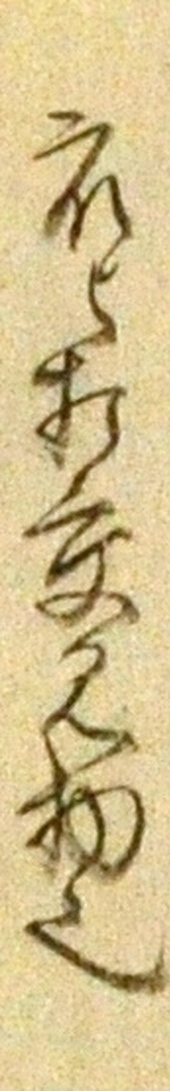衆被打交見物也
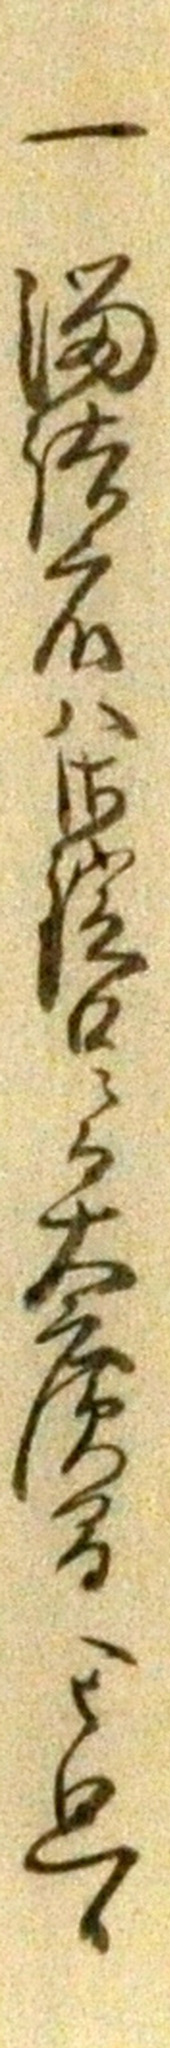一溜詰衆ハ御錠口ニ而大広間へ被廻候
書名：御馳走御能ノ節ノ留外
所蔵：伊那市立高遠町図書館・合同会社AMANE
